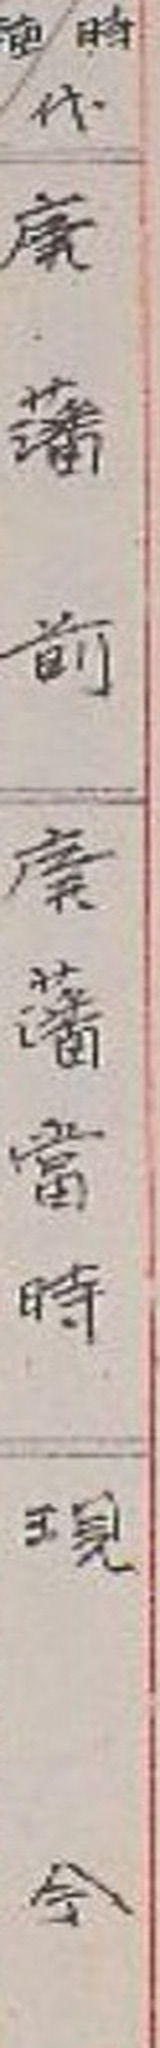時代廃藩前廃藩当時現今
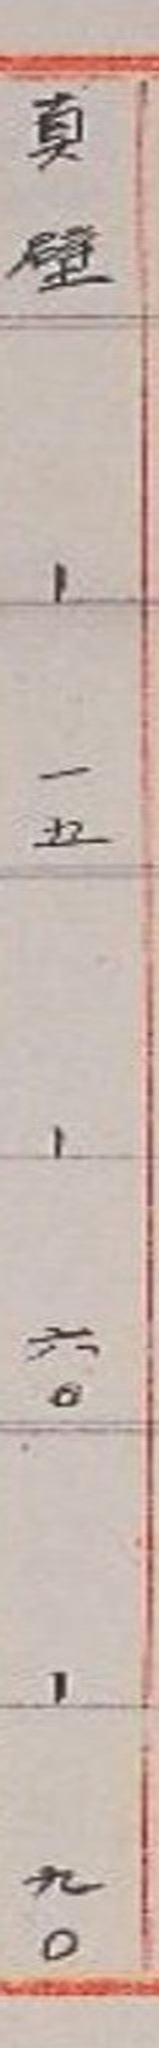真壁―一五―六〇―九〇
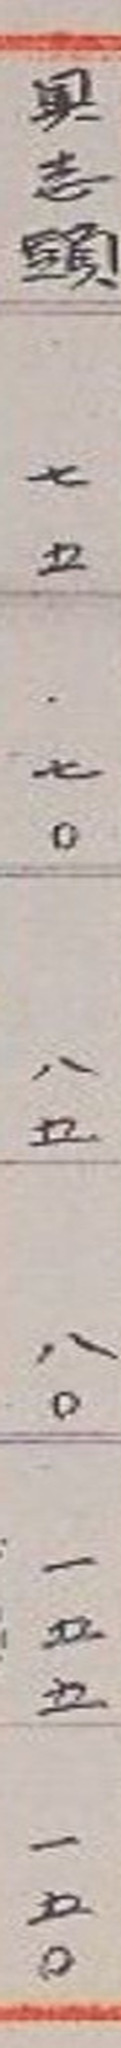具志頭七五七〇八五八〇一五五一五〇
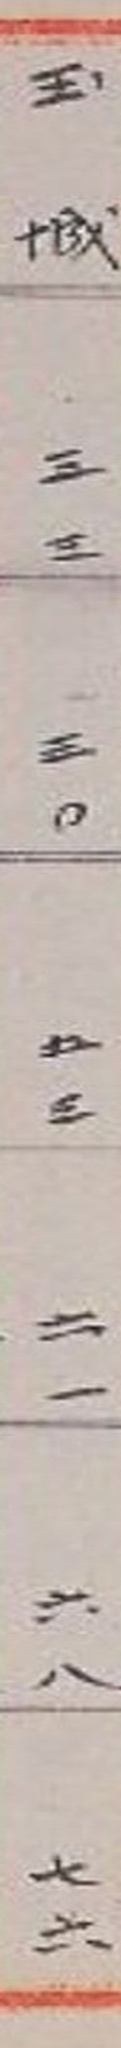玉城三三三〇五三六一六八七六

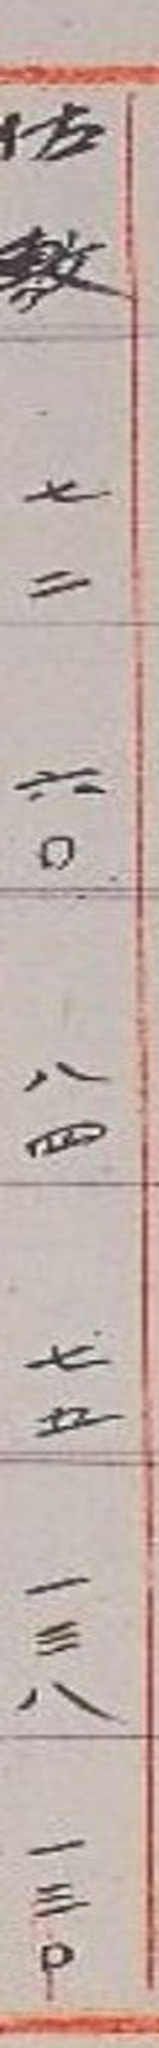佐敷七二六〇八四七五一三八一三〇
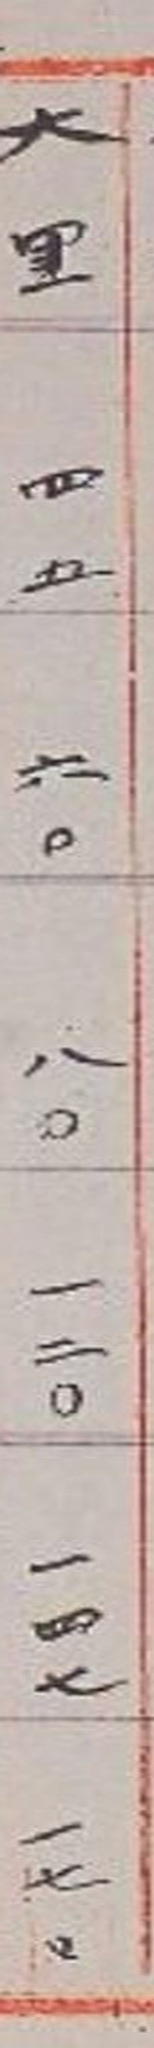大里四五六〇八〇一二〇一四七一七〇
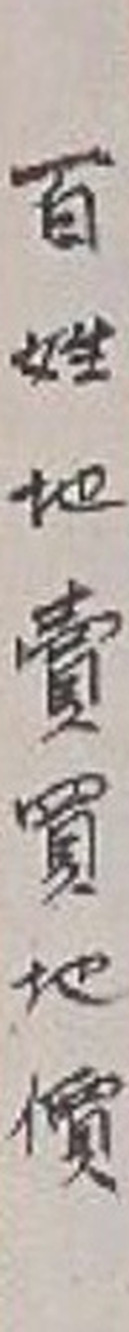百姓地売買地価
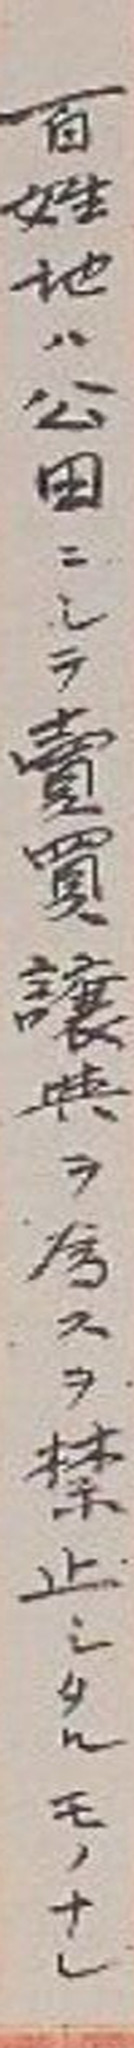百姓地ハ公田ニシテ売買譲与ヲ為スヲ禁止シタルモノナレ
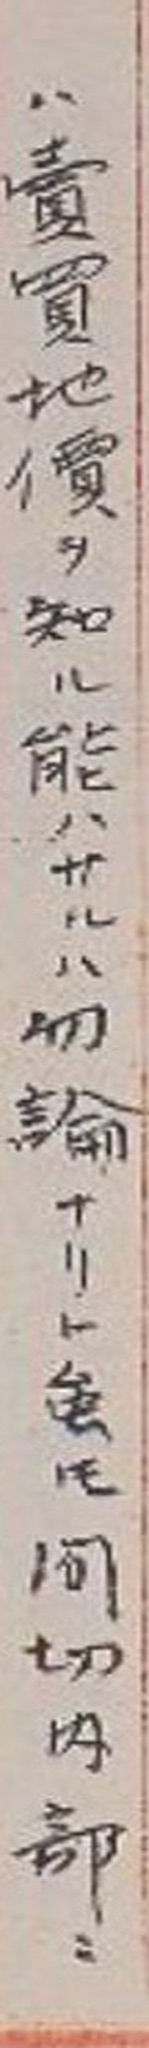ハ売買地価ヲ知ル能ハサルハ勿論ナリト雖トモ間切内部ニ

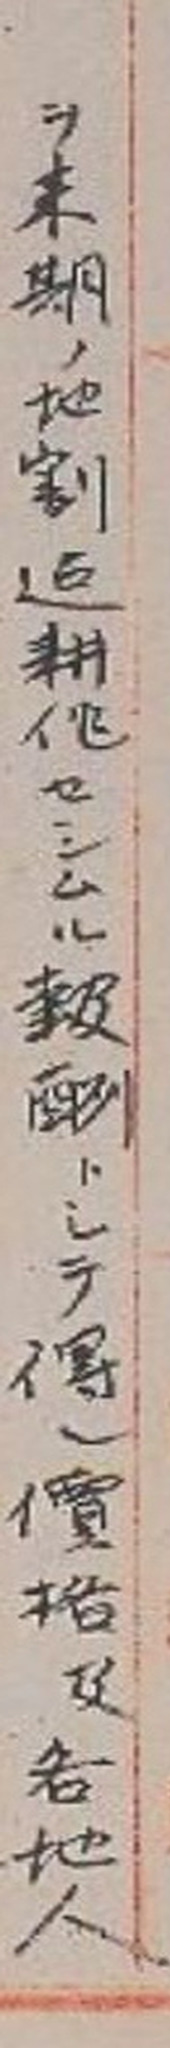ヲ末期ノ地割迄耕作セシムル報酬トシテ得ル価格及各地人
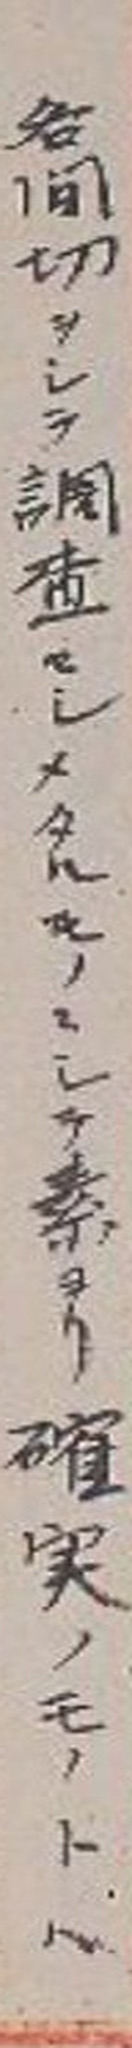各間切ヲシテ調査セシメタルモノニシテ素ヨリ確実ノモノトハ
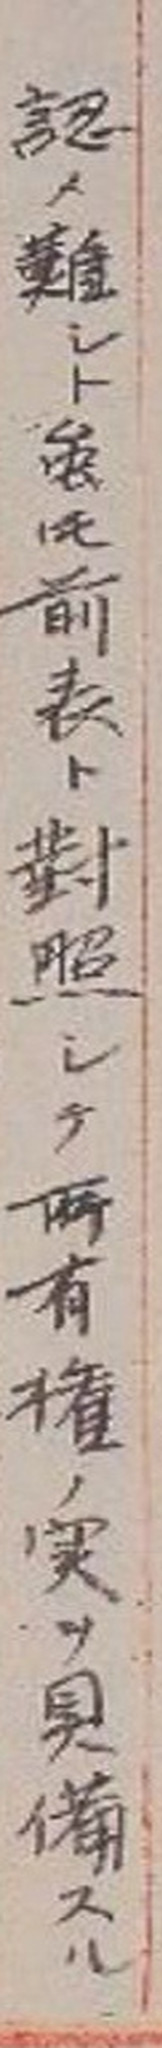認メ難シト雖トモ前表ト対照シテ所有権ノ実ヲ具備スル
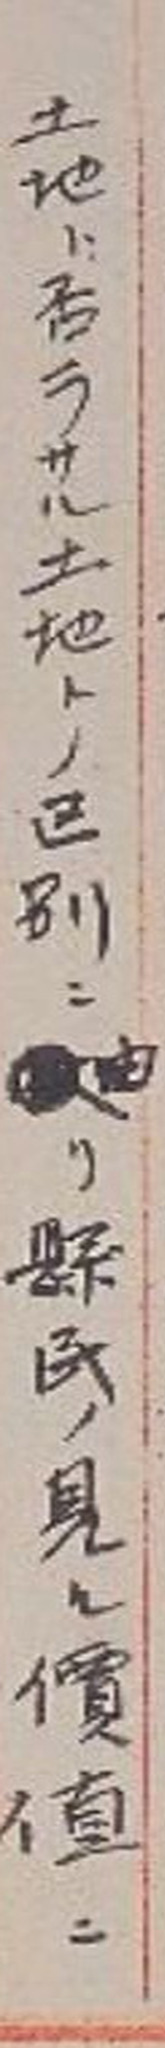土地ト否ラサル土地トノ区別ニ由リ県民ノ見ル価値ニ
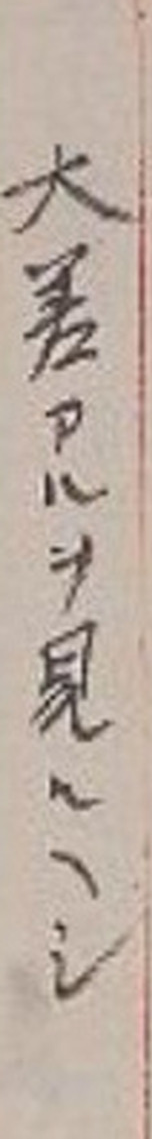大差アルヲ見ルヘシ
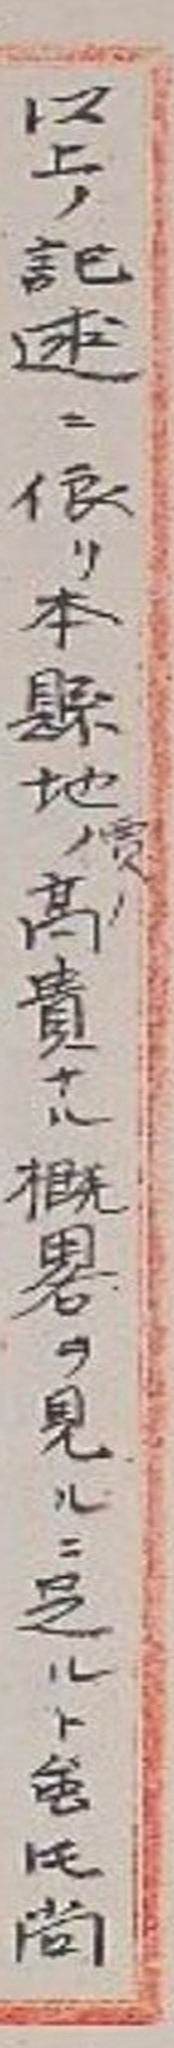以上ノ記述ニ依リ本県地価ノ高貴ナル概略ヲ見ルニ足ルト雖トモ尚
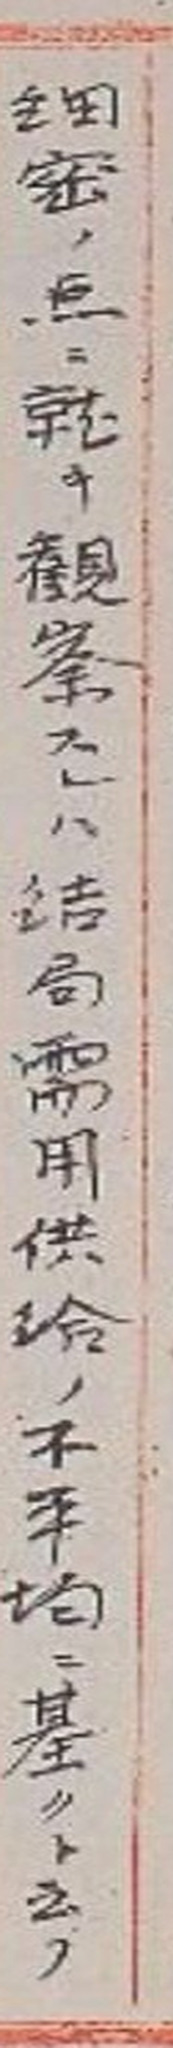細密ノ点ニ就キ観察スレハ結局需用供給ノ不平均ニ基クト云フ
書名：本県地価ノ高キ理由調書
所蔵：University of the Ryukyus Library
